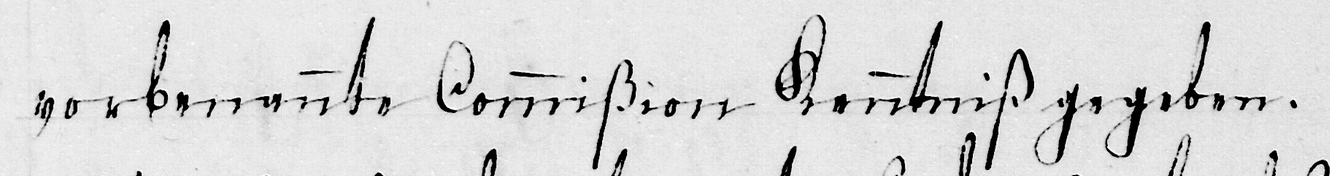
vorbenannte Commißion Kenntniß gegeben.
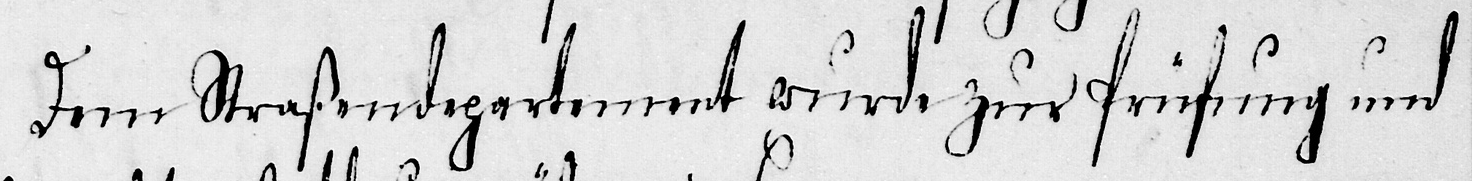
Dem Straßendepartement wurde zur Prüfung und
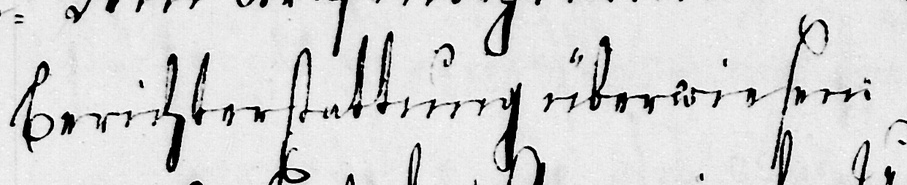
Berichterstattung überwiesen:
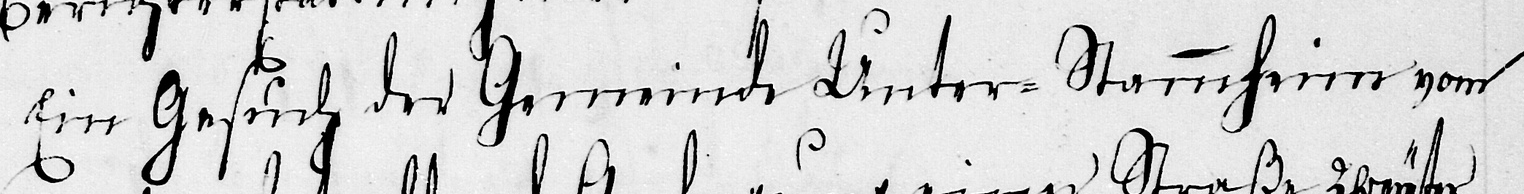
Ein Gesuch der Gemeinde Unter-Stammheim vom
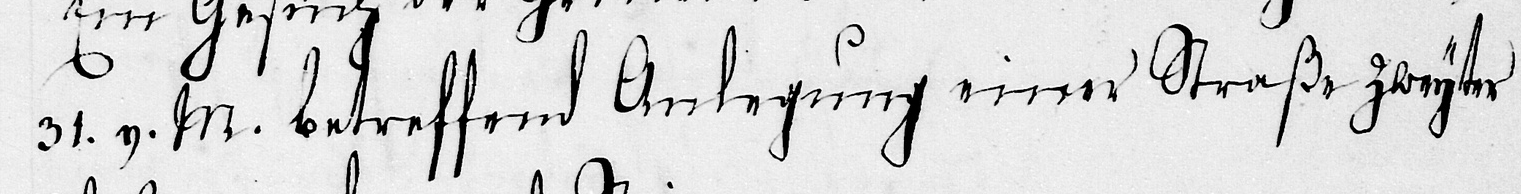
31. v. M. betreffend Anlegung einer Straße zweyter
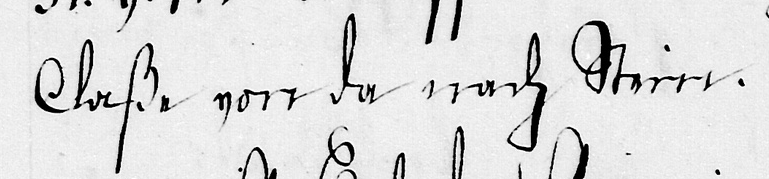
Claße von da nach Stein.
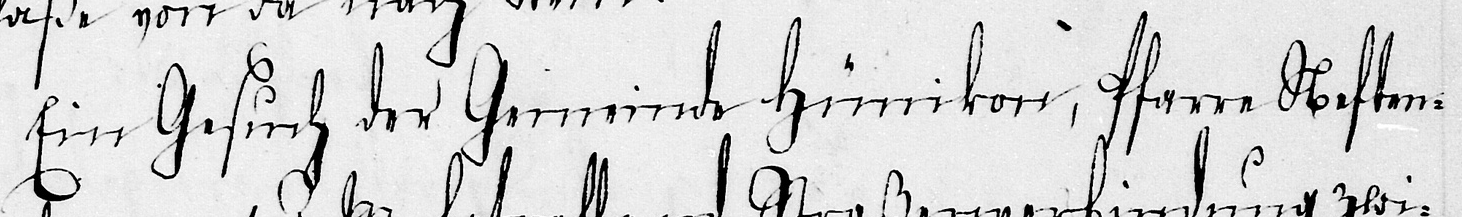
Ein Gesuch der Gemeinde Hünikon, Pfarre Neften¬
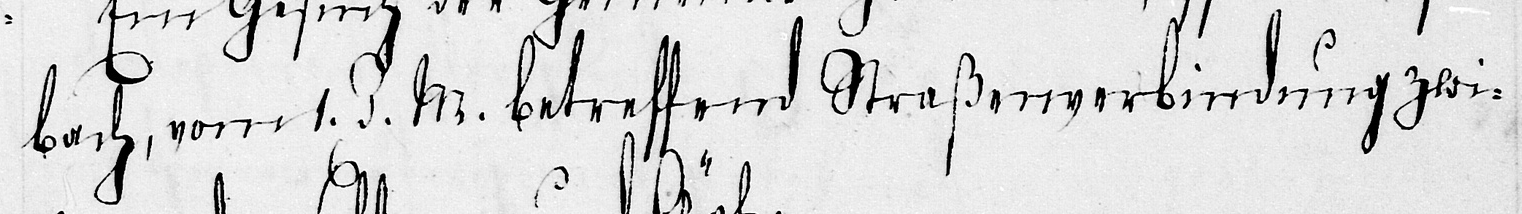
bach, vom 1. d. M. betreffend Straßenverbindung zwi¬
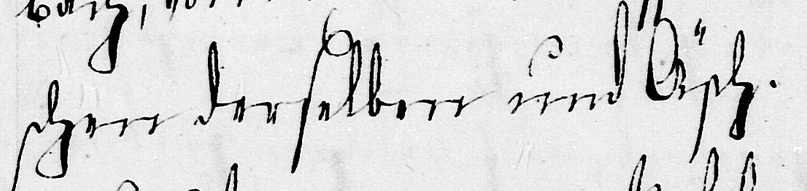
schen derselben und Äsch.
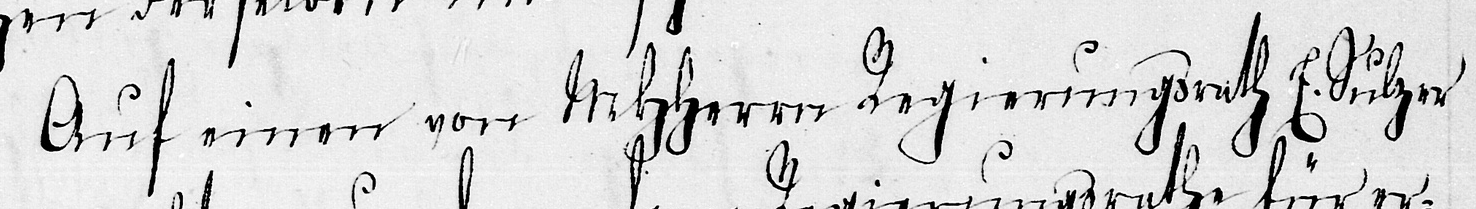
Auf einen von MHHerrn Regierungsrath E. Sulzer
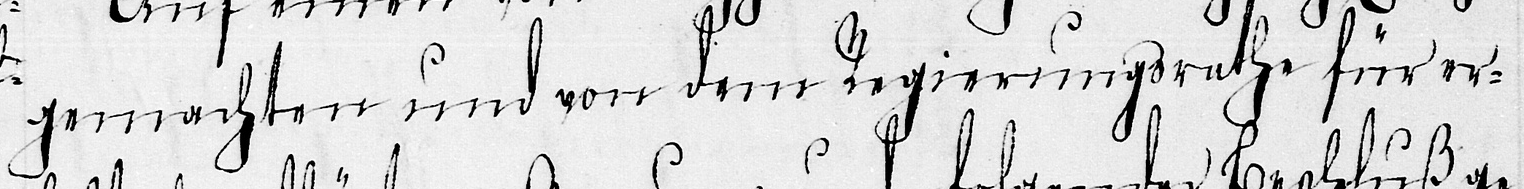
gemachten und von dem Regierungsrathe für er¬
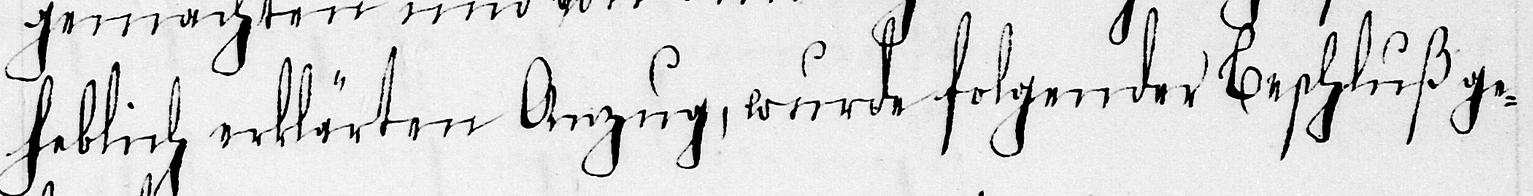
heblich erklärten Anzug, wurde folgender Beschluß ge¬
